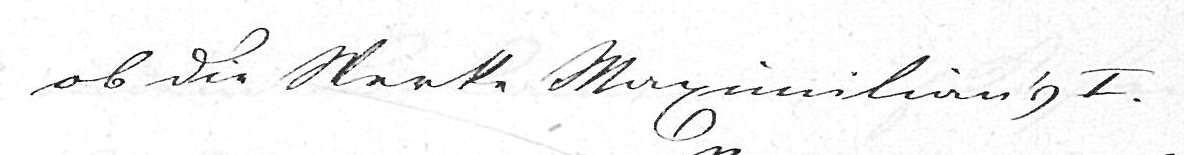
ob die Werke Maximilian's I.
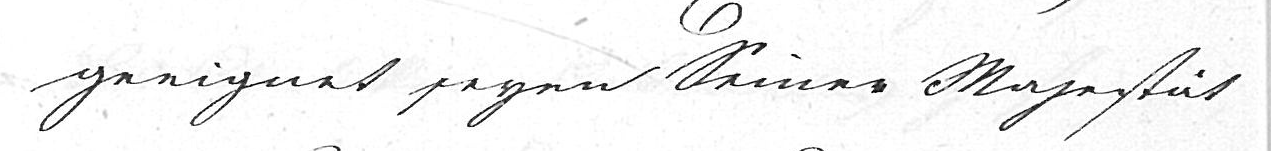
geeignet seyen Seiner Majestät
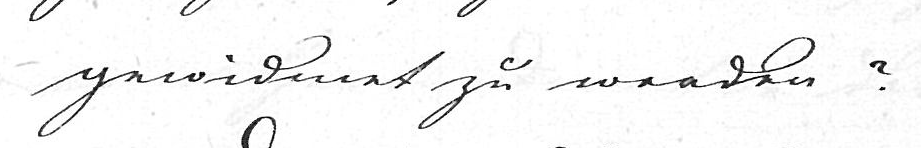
gewidmet zu werden?
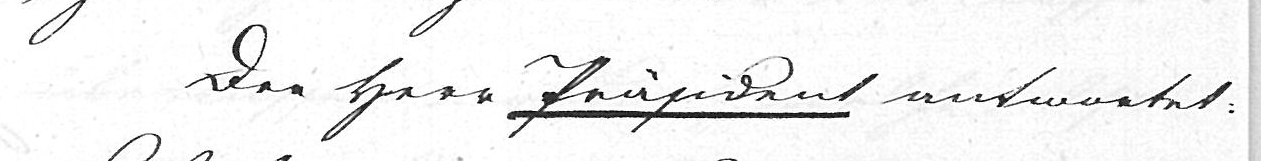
Der Herr Präsident antwortet:
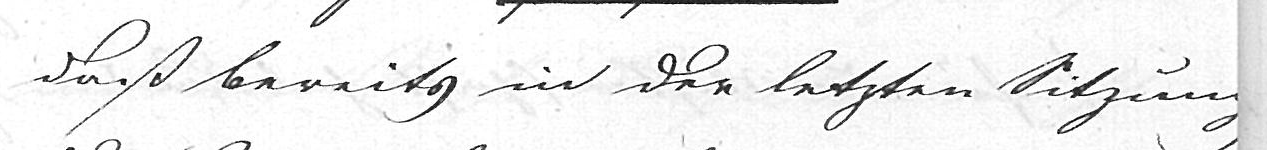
daß bereits in der letzten Sitzung
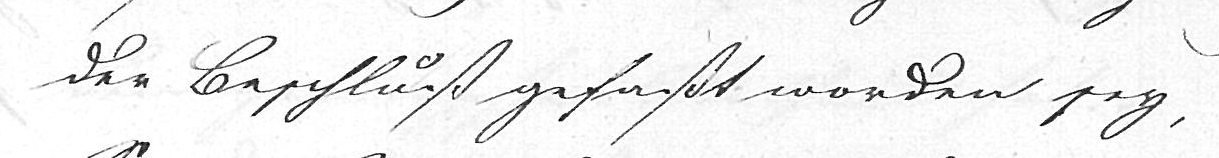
der Beschluß gefaßt worden sey,
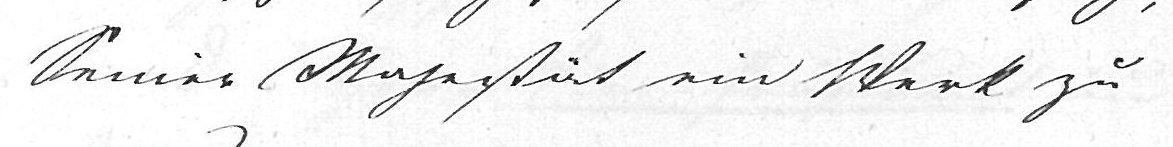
Seiner Majestät ein Werk zu
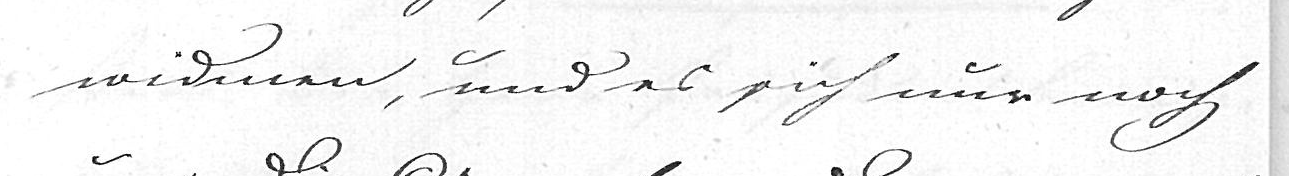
widmen, und es sich nur noch
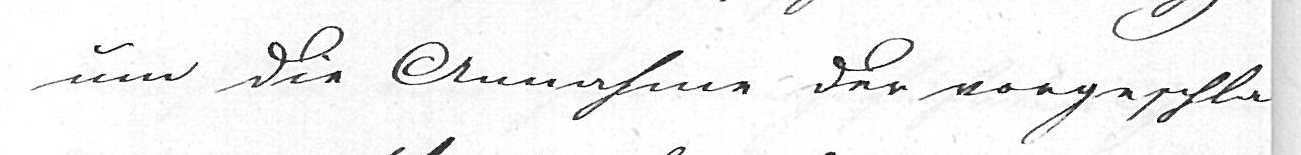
um die Annahme der vorgeschla-
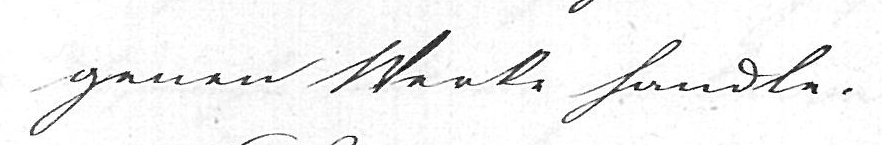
genen Werke handle.
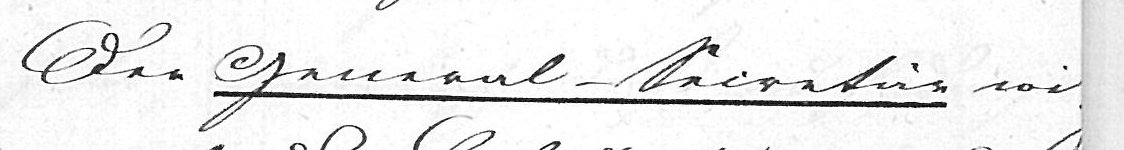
Der General-Secretär wi-
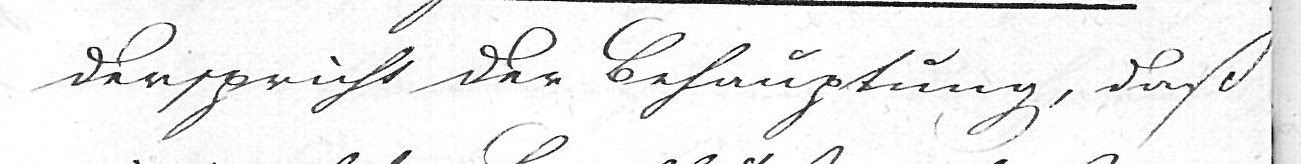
derspricht der Behauptung, daß
